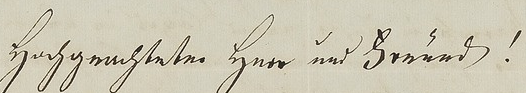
Hochgeachteter Herr und Freund!
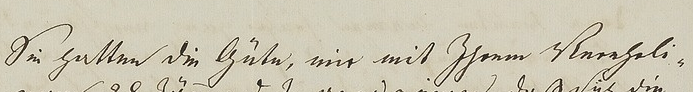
Sie hatten die Güte, mir mit Ihrem Verehrli-
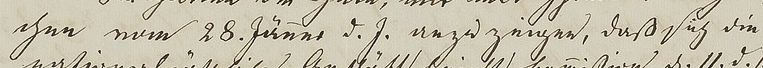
chen vom 28. Jänner d. J. anzuzeigen, daß sich die
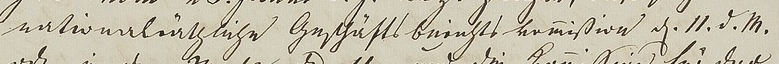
nationalräthliche Geschäftsberichtskommission d. 11. d. M.
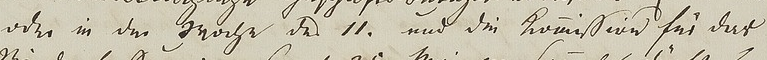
oder in der Woche des 11. und die Kommission für das
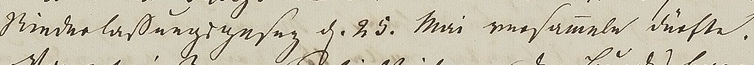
Niederlassungsgesez d. 25. Mai versammeln dürfte.
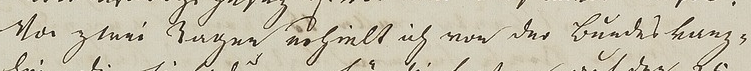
Vor zwei Tagen erhielt ich von der Bundeskanz-
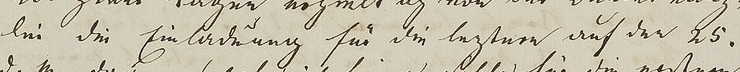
lei die Einladung für die leztere auf den 25.
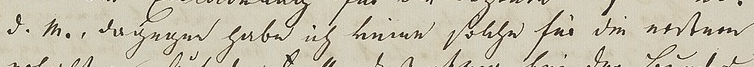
d. M., dagegen habe ich keine solche für die erstere
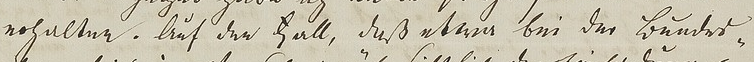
erhalten. Auf den Fall, daß etwa bei der Bundes-
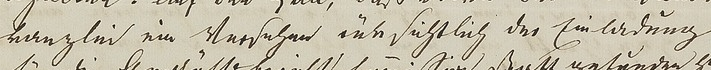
kanzlei ein Versehen rüksichtlich der Einladung
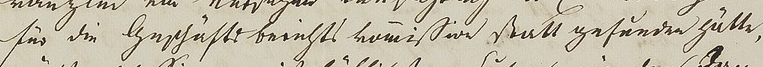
für die Geschäftsberichtskommission statt gefunden hätte,
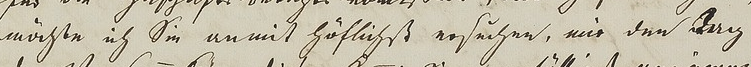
möchte ich Sie anmit höflichst ersuchen, mir den Tag
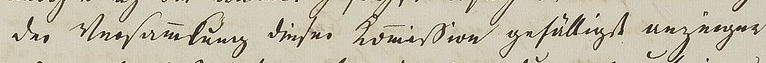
der Versammlung dieser Kommission gefälligst anzeigen
